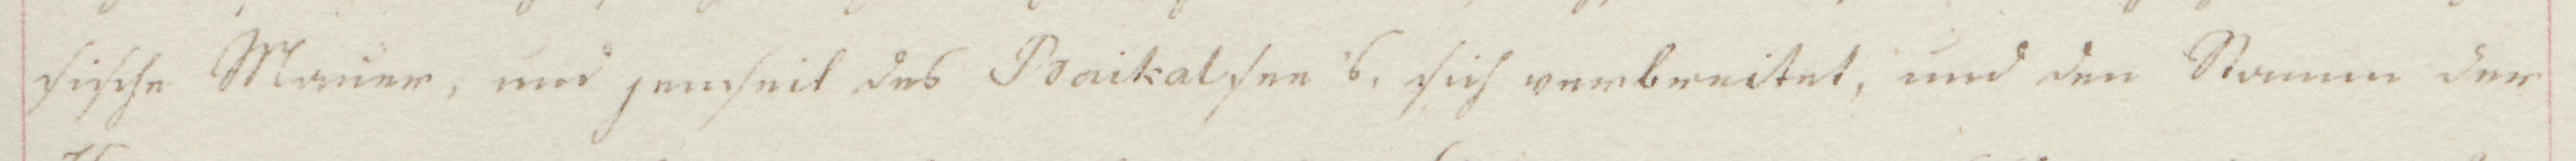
sische Mauer, und jenseit des Baikalsee's, sich verbreitet, und den Stamm der
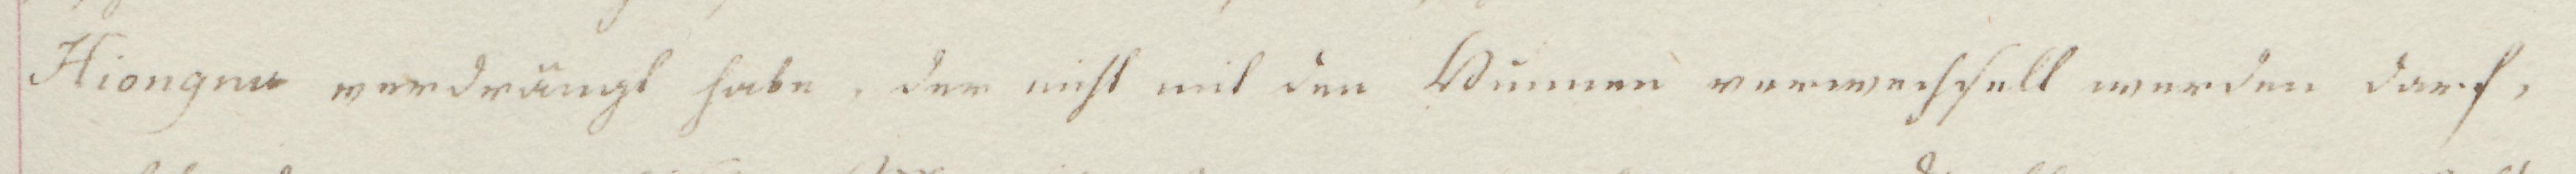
Hiongnu verdrängt habe, der nicht mit den Hunnen verwechselt werden darf,
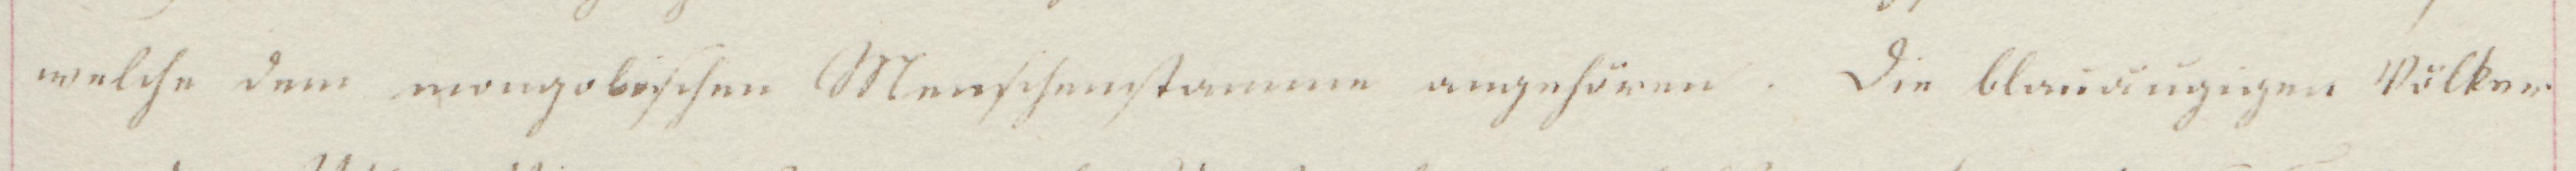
welche dem mongolischen Menschenstamme angehören. Die blauäugigen Völker
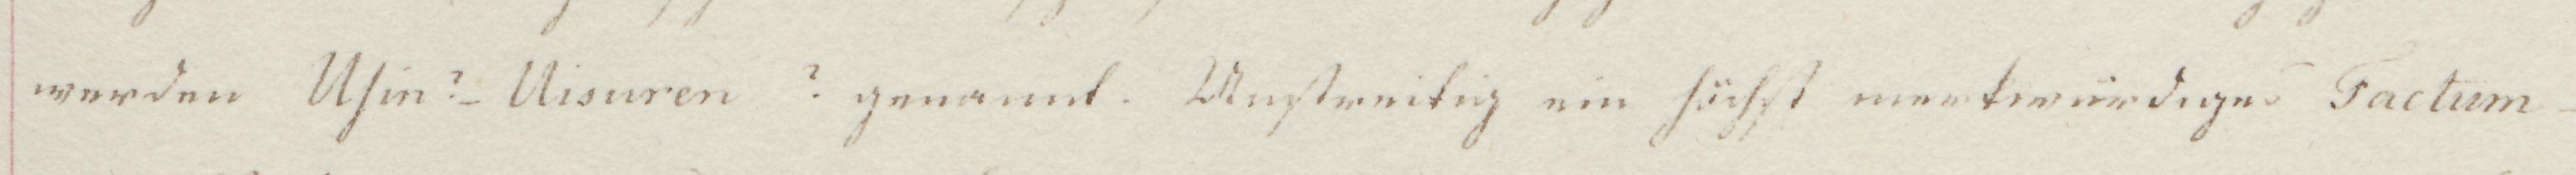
werden Usin ? – Uisuren ? genannt. Unstreitig ein höchst merkwürdiges Factum –
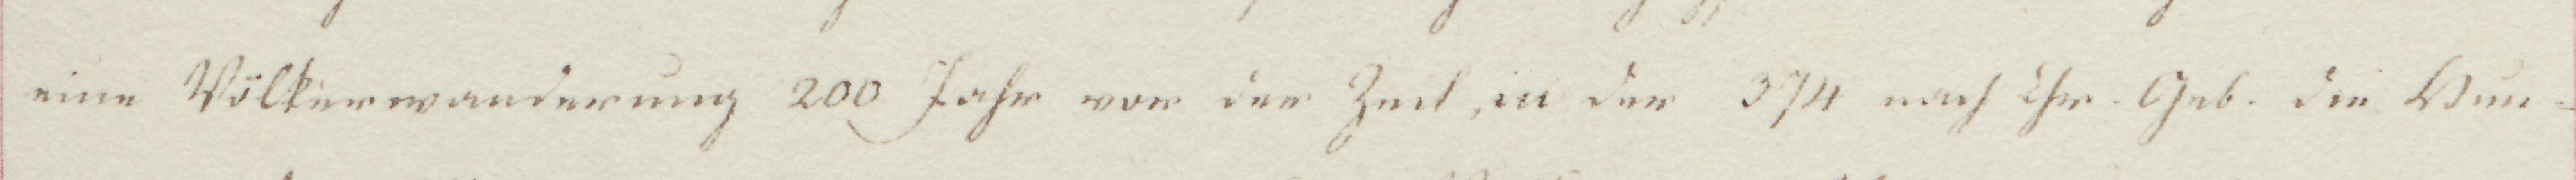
eine Völkerwanderung 200 Jahr vor der Zeit, in der 374 nach Chr. Geb. die Hun-
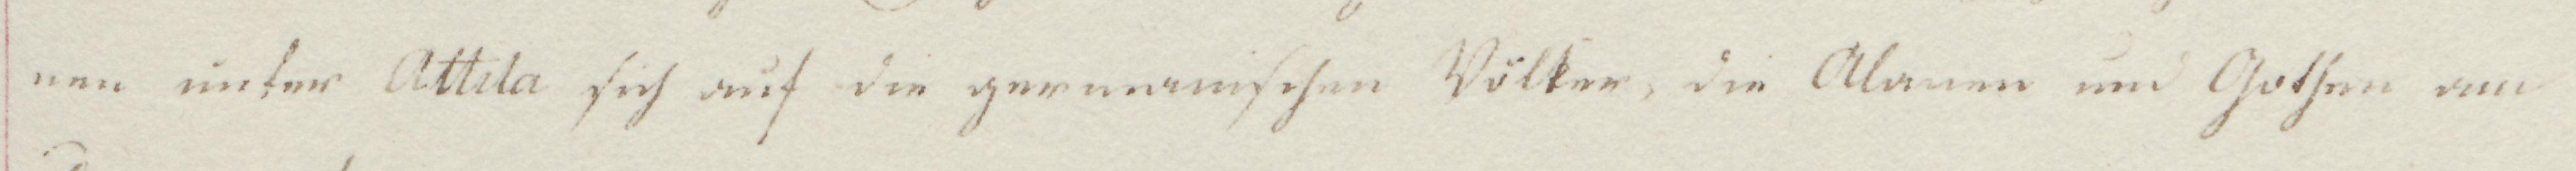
nen unter Attila sich auf die germanischen Völker, die Alanen und Gothen am
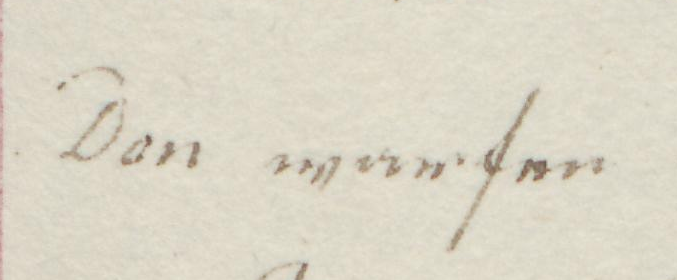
Don warfen.
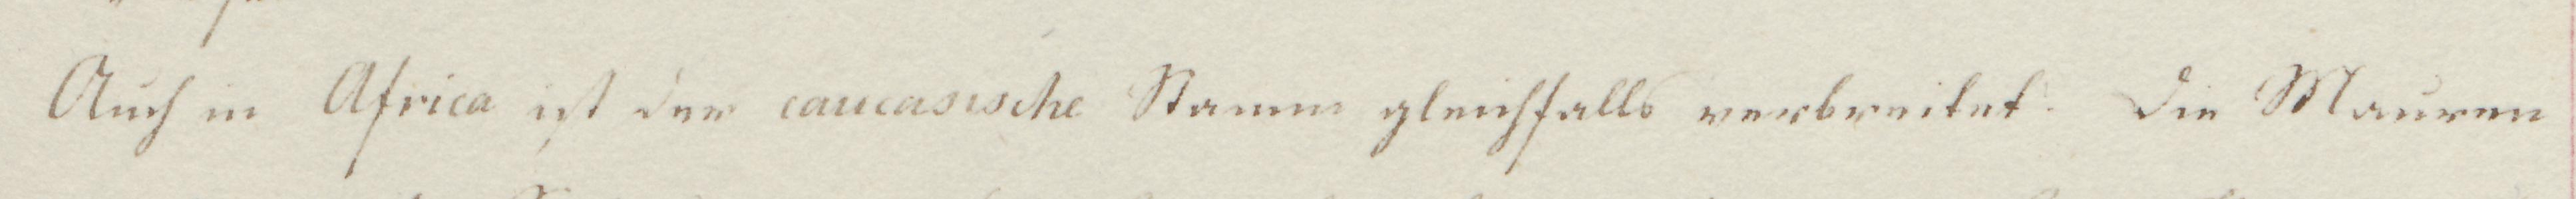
Auch in Africa ist der caucasische Stamm gleichfalls verbreitet. Die Mauren
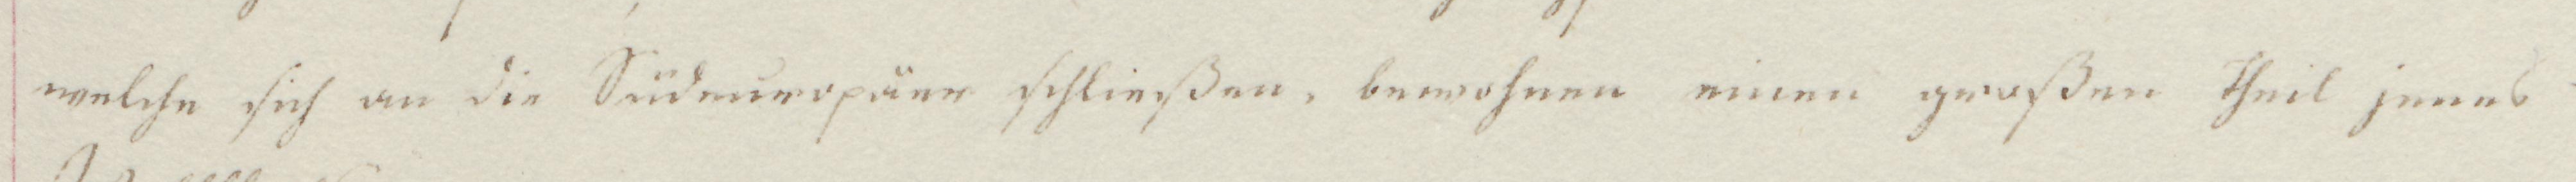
welche sich an die Südeuropäer schließen, bewohnen einen großen Theil jenes
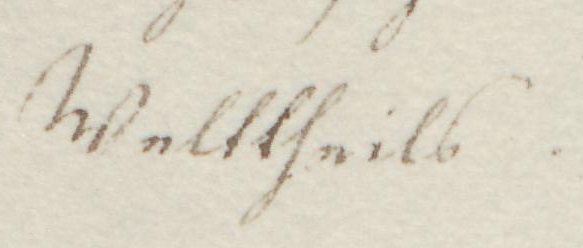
Welttheils.
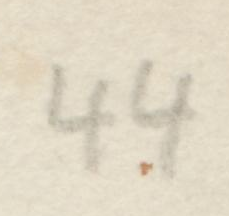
Gesicht
